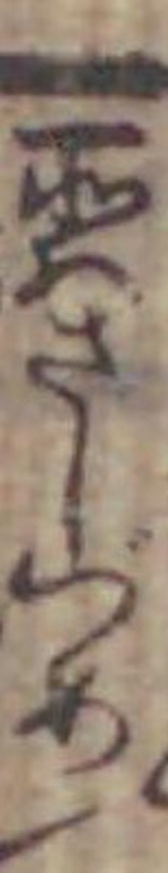所はさしづめ
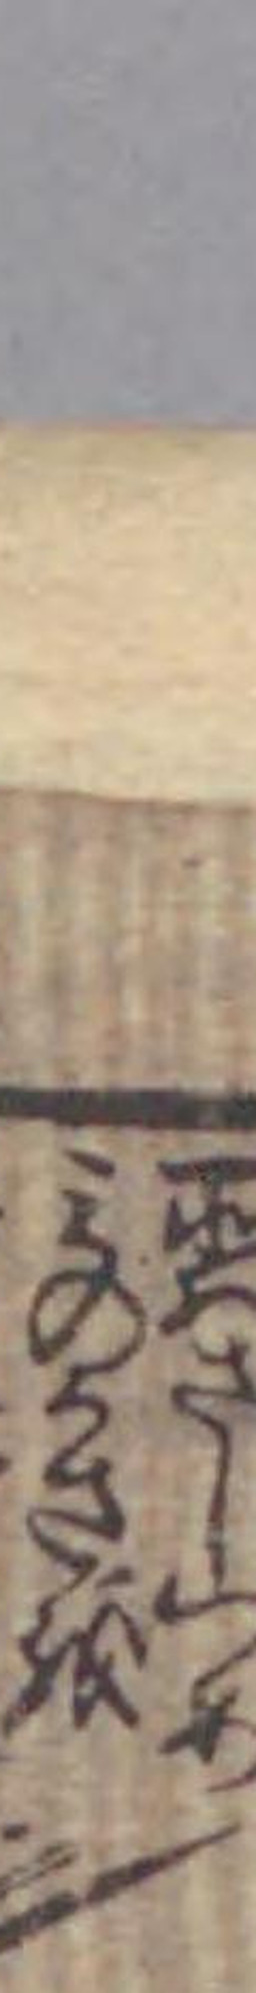みのかさを
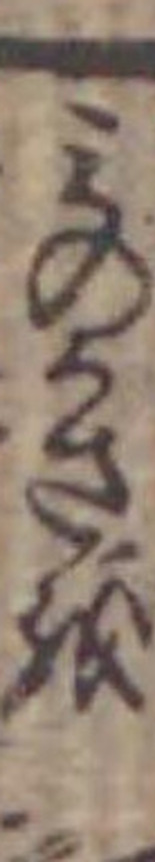みのかさを
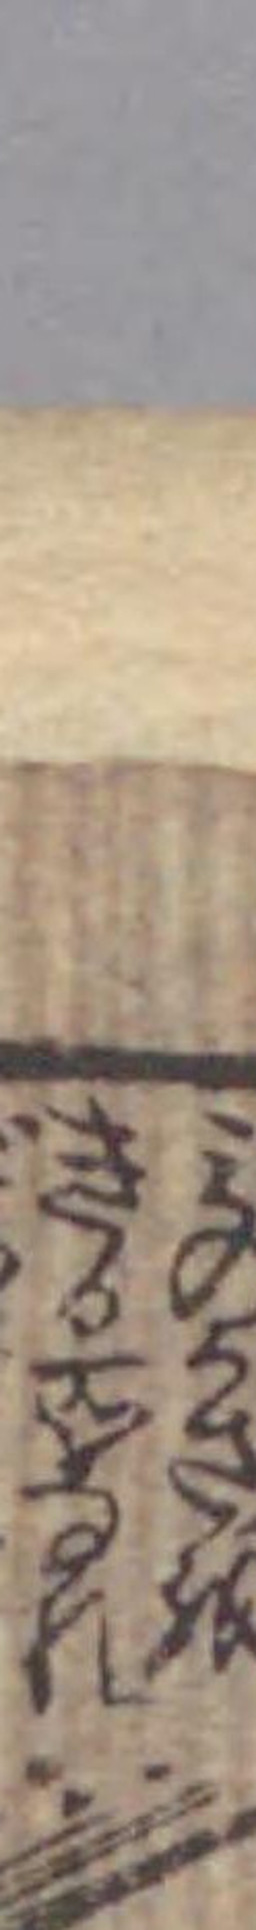きる所なれ
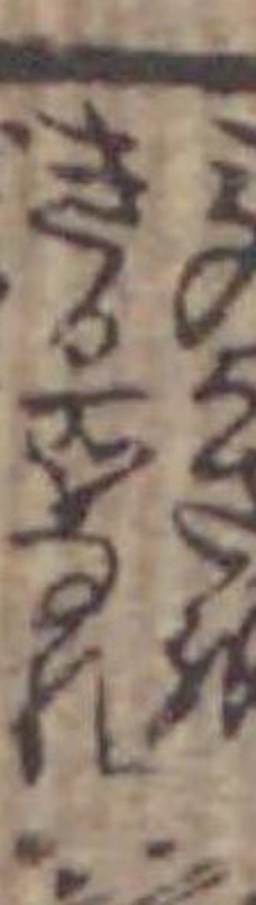きる所なれ
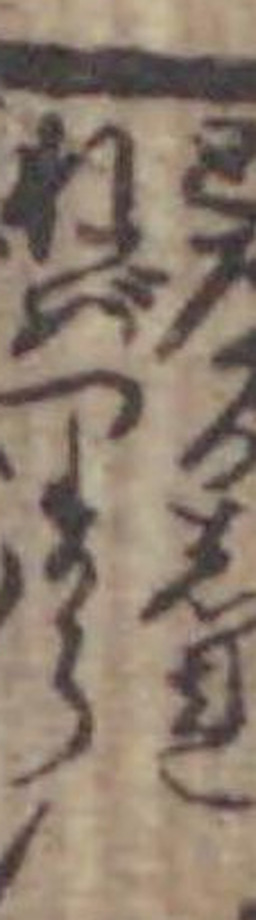ねばつまら
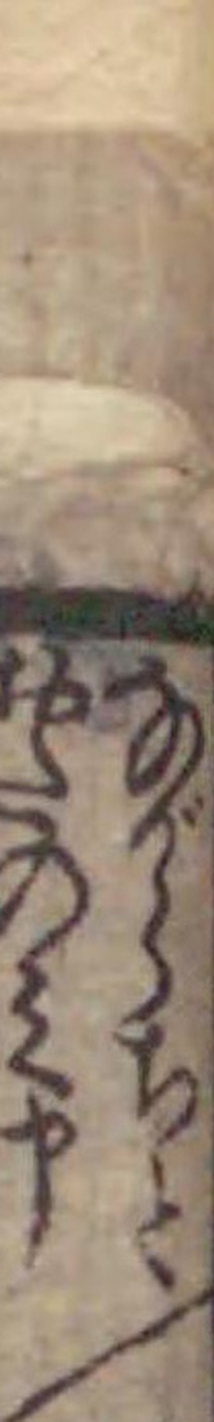おたのみ申
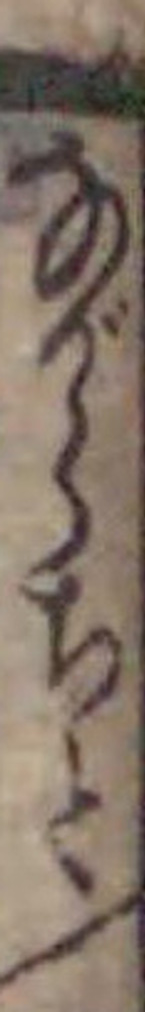ながらちと
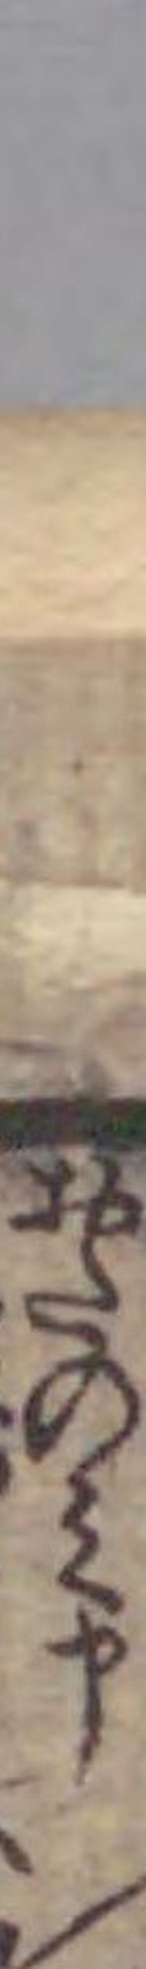おたのみ申
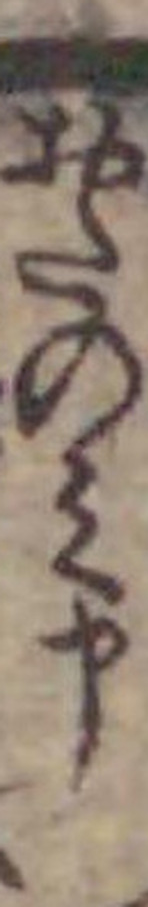おたのみ申
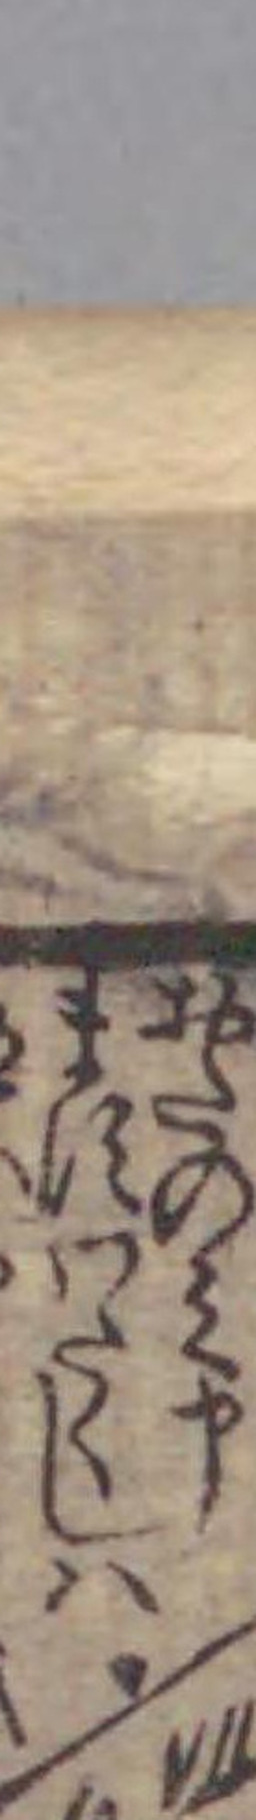ますわたくしは
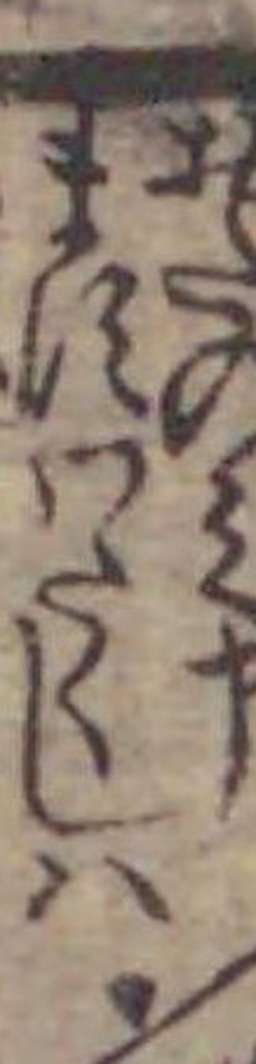ますわたくしは
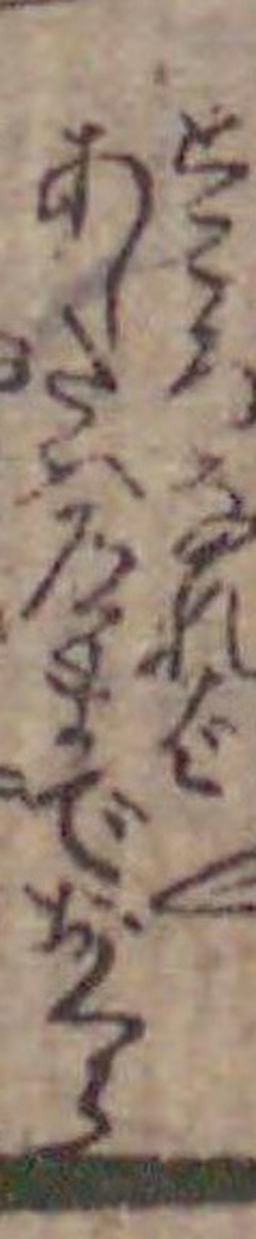あしたは道までおくら
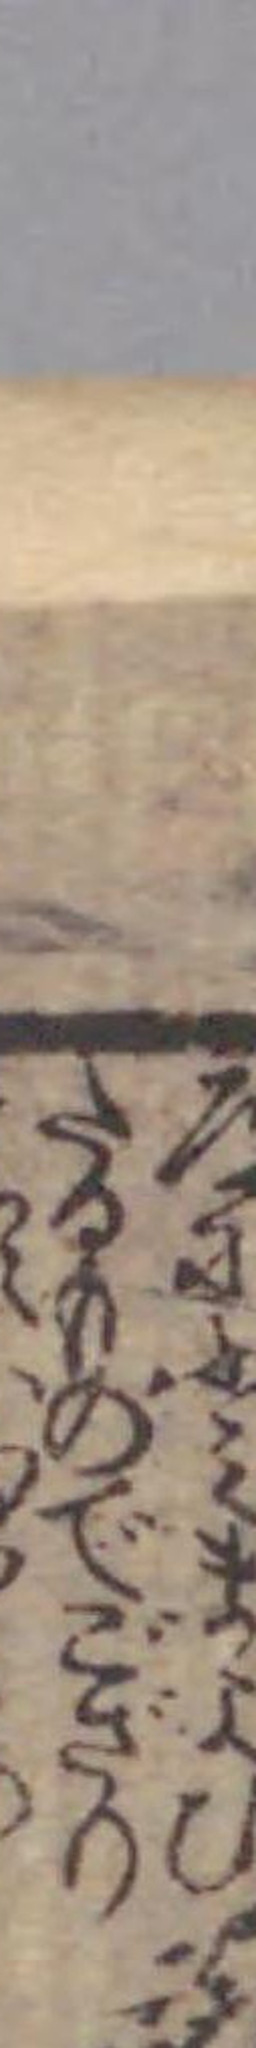たるものでござり
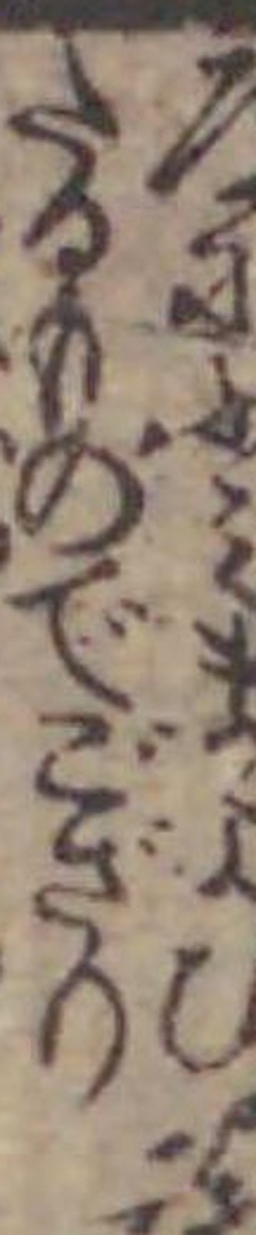たるものでござり
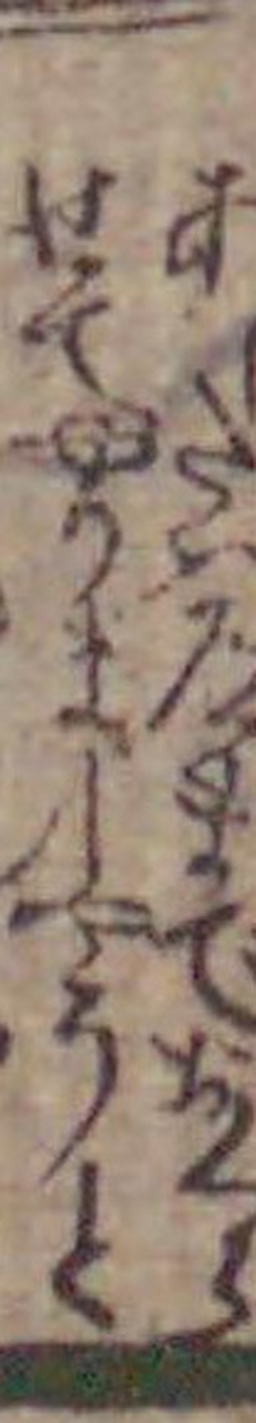せてやりましやうと
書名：即席耳学問 : 3巻
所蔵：国立国会図書館 National Diet Library, JAPAN
